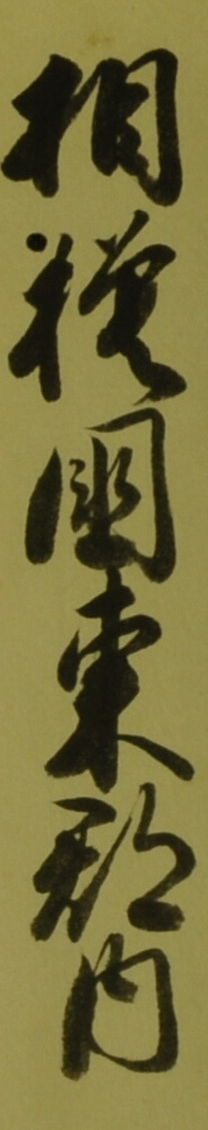相模国東郡内
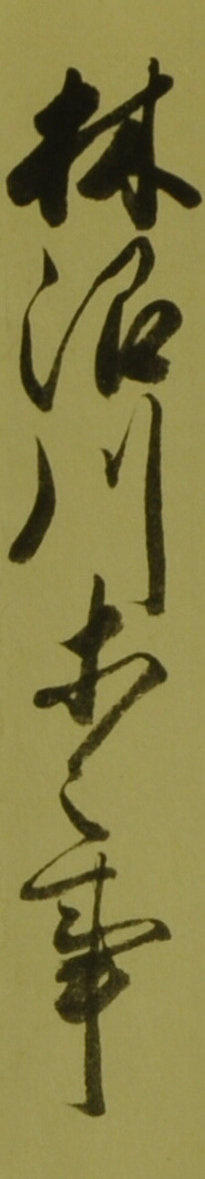林沼川等之事
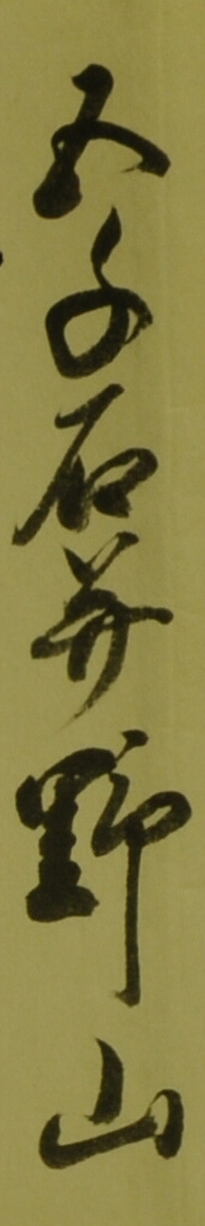五千石幷野山
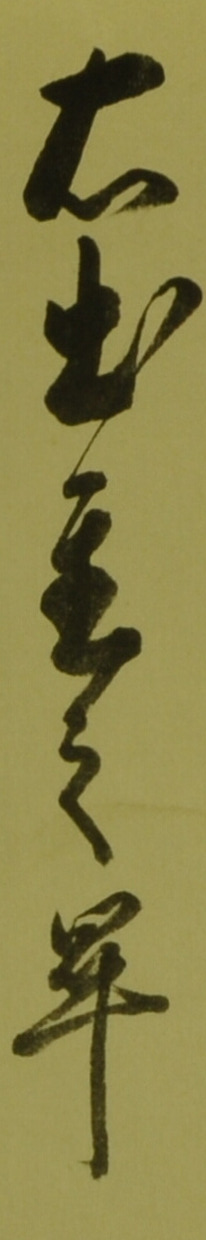右出置之畢
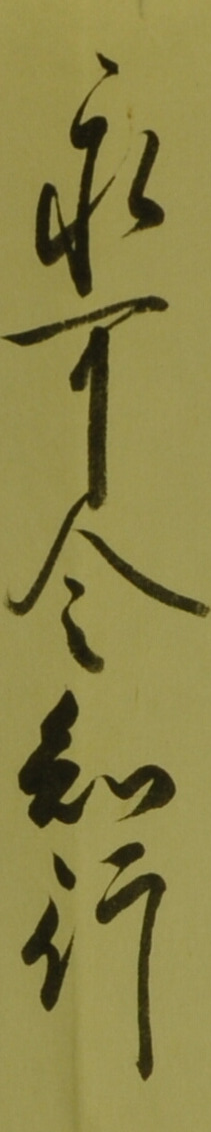永可令知行
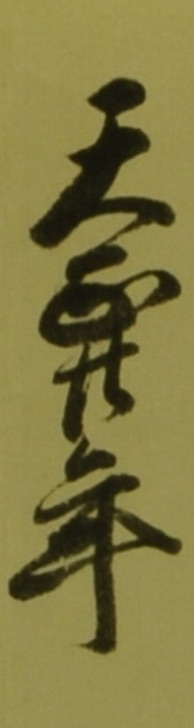天正廿年
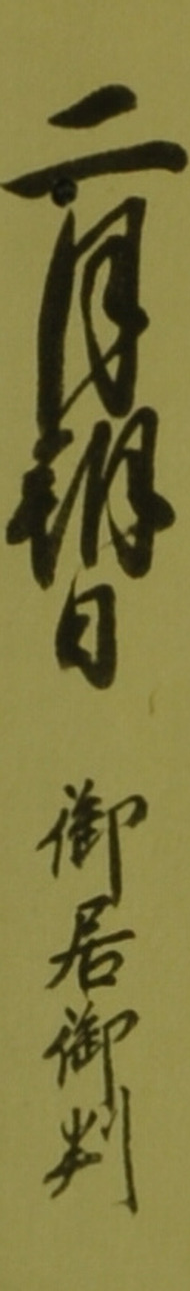二月朔日御居御判
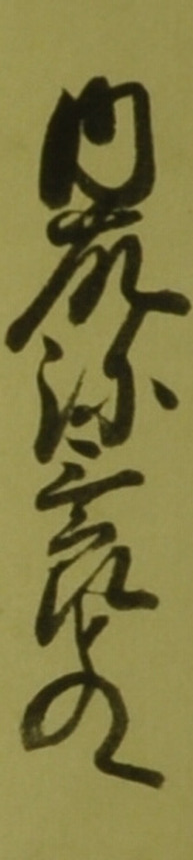内藤弥三郎とのへ
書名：御判物写
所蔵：伊那市立高遠町図書館・合同会社AMANE
